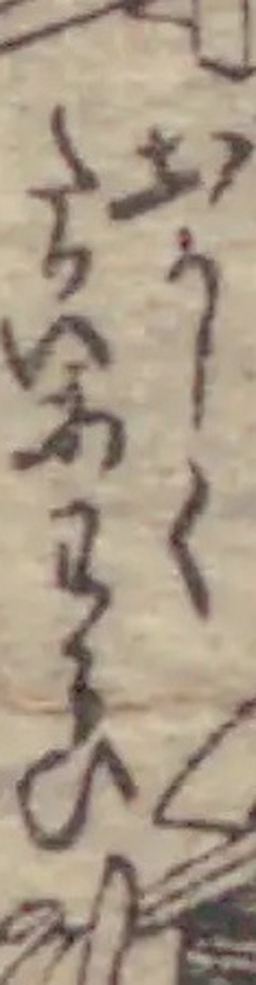たかいにわらひ
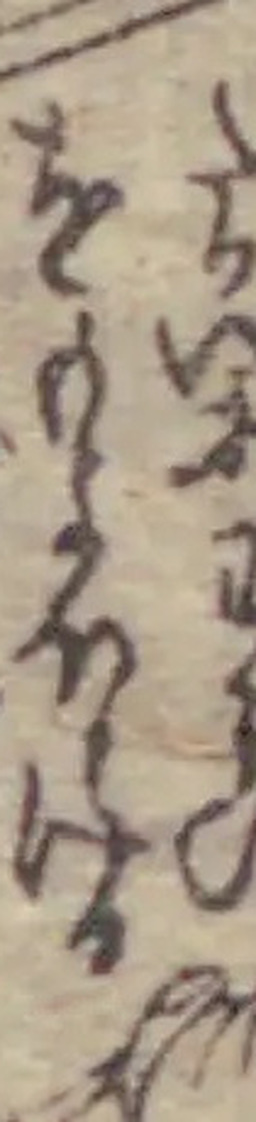をもよほしける
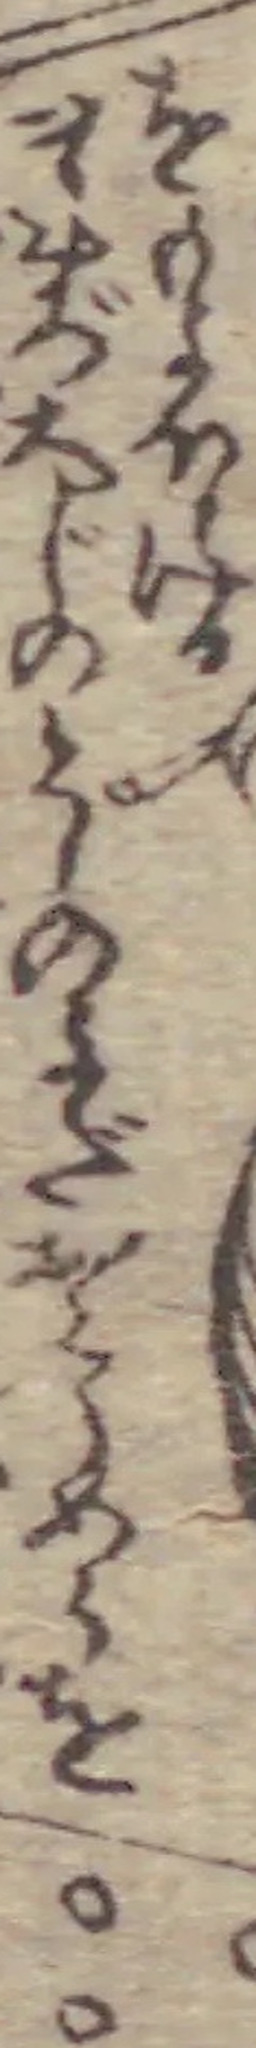まづ大じのとしのよだおとうめうを
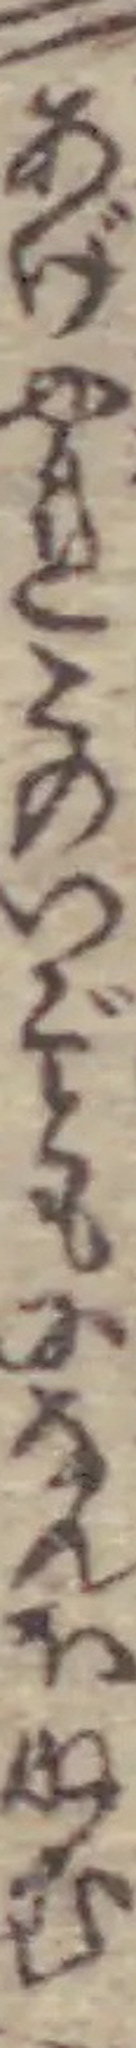あげやれこのいごともになんほねむ
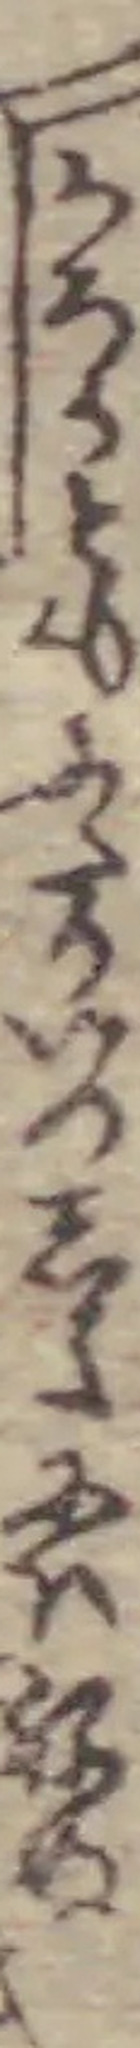かろうともふたりいつしよにはねぬ
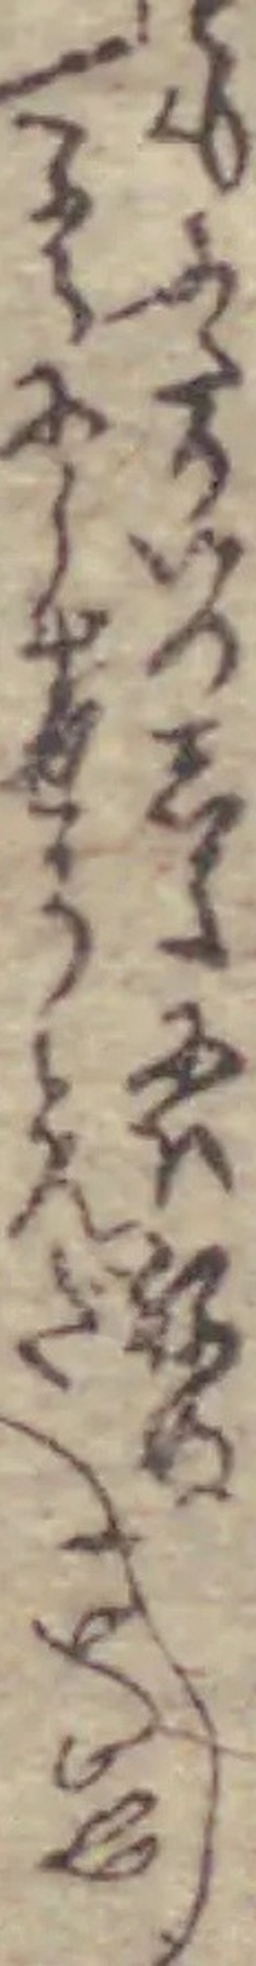ようにしませうとんだ
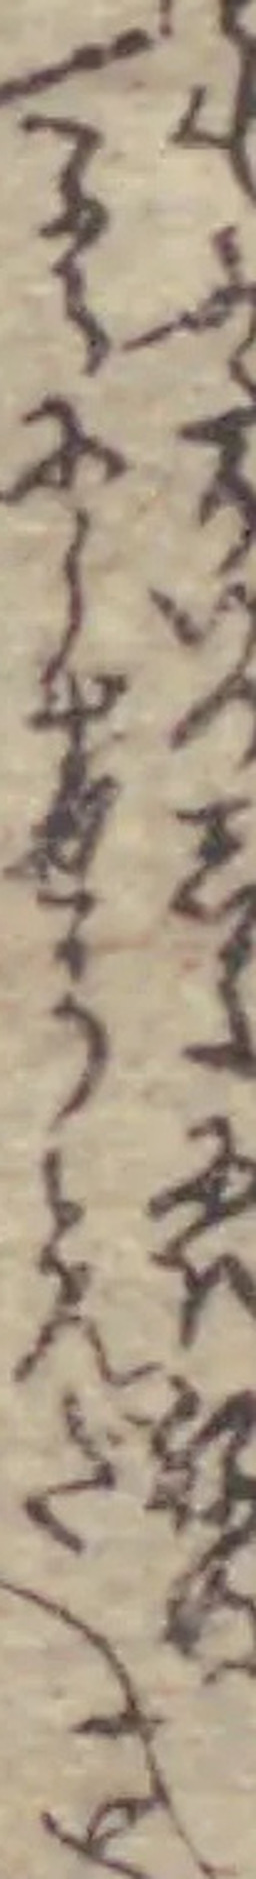ようにしませうとんだ
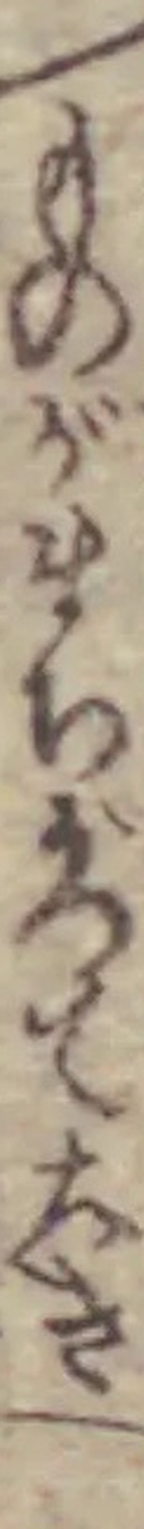ものがまちがつて大き
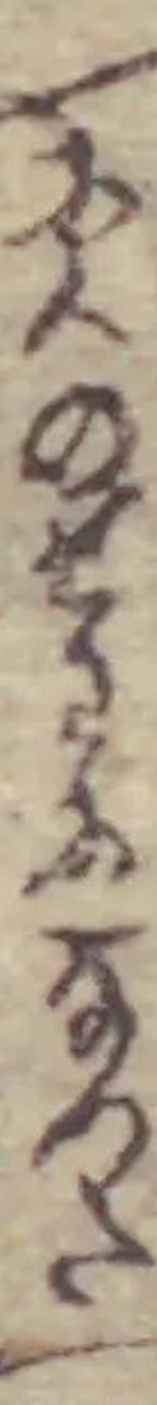に人のせわになつた
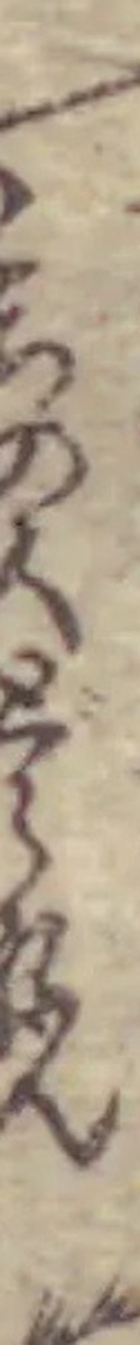とちの人どうねん
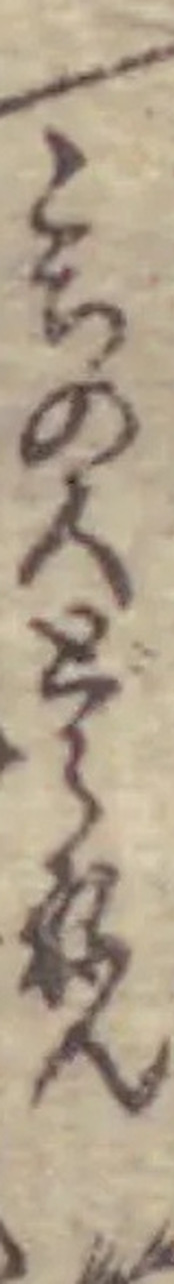とちの人どうねん
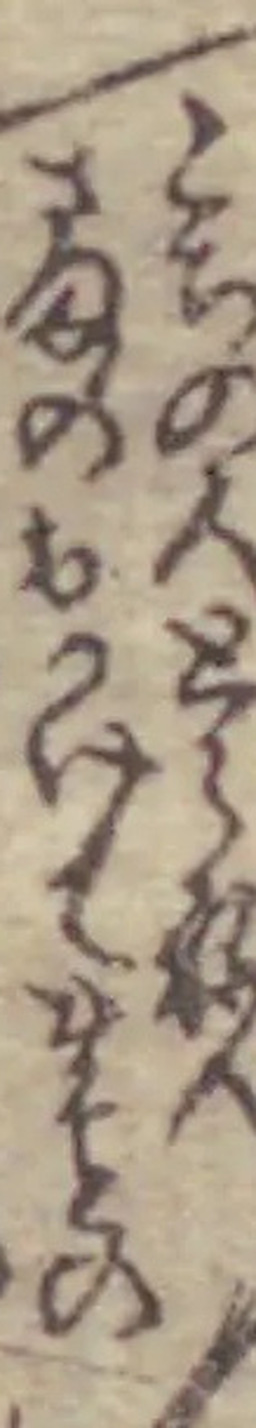さまのおかけてまことの
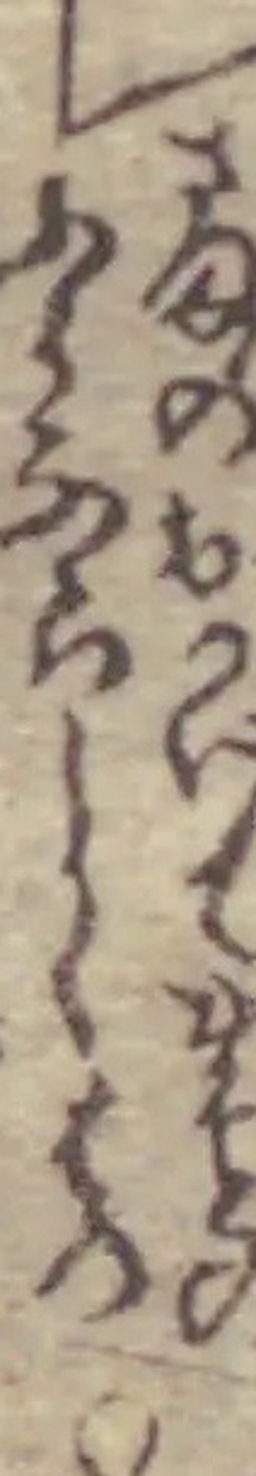ふうふらしくはつ
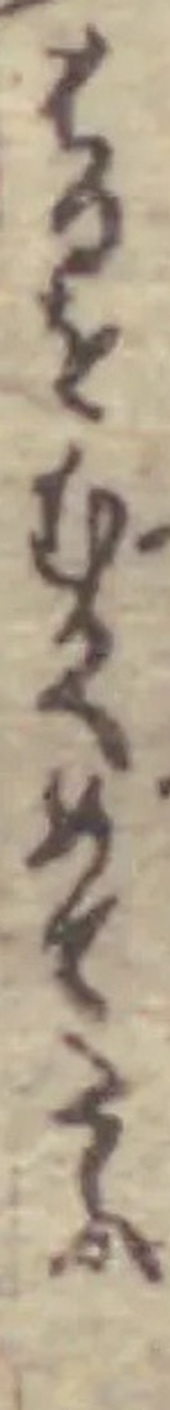はるをむかへめてたふ
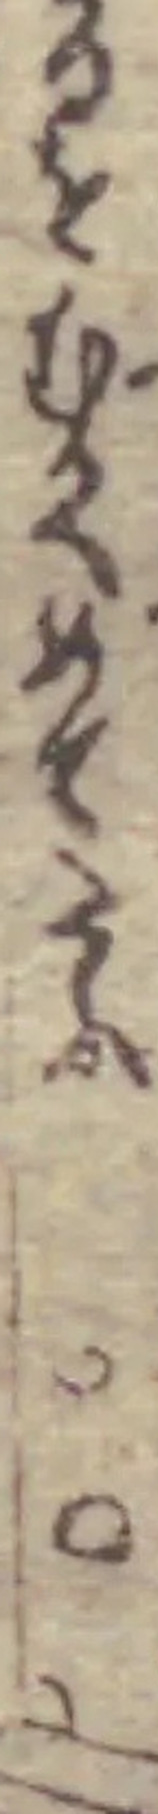はるをむかへめてたふ
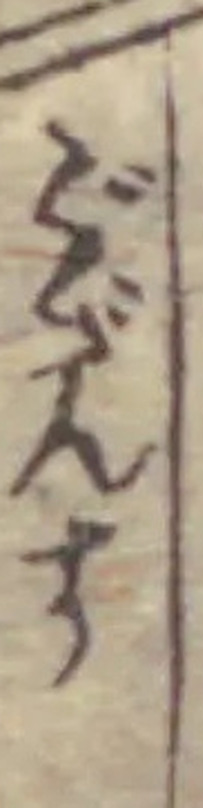ござんす
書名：飛た間違矢口噂 2巻
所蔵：国立国会図書館 National Diet Library, JAPAN
